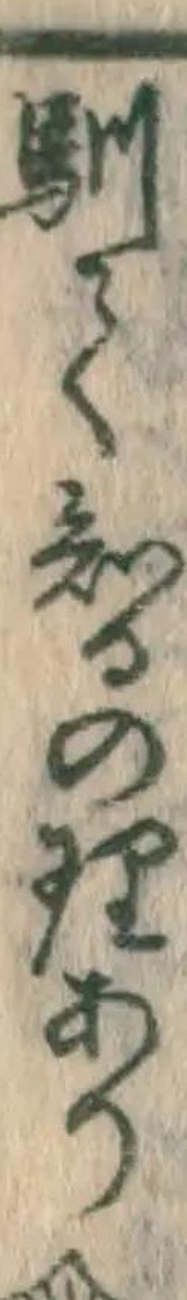馴て知るの理あり
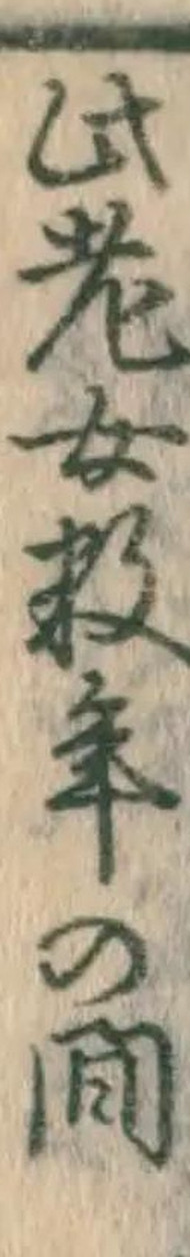此老女数年の間
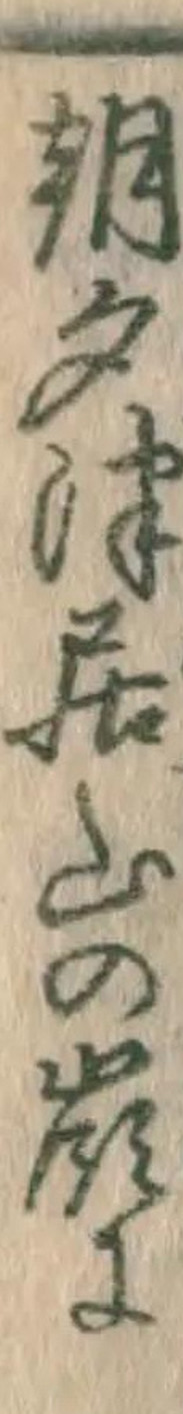朝夕津居山の嶺に
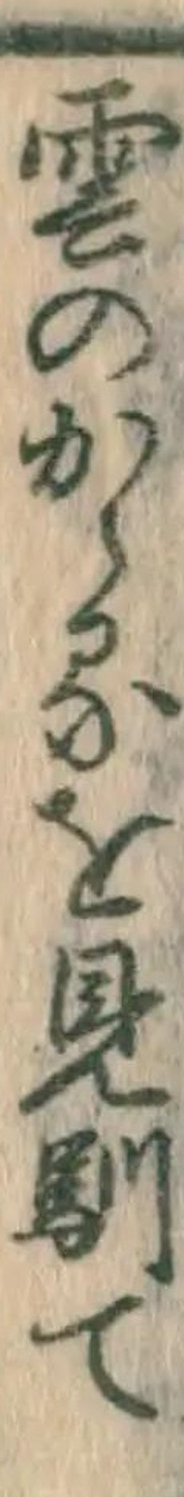雲のかゝるを見馴て
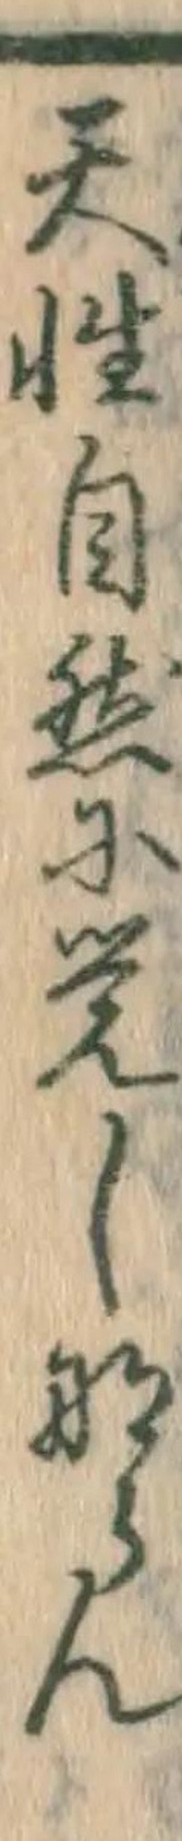天性自然に覚しならん
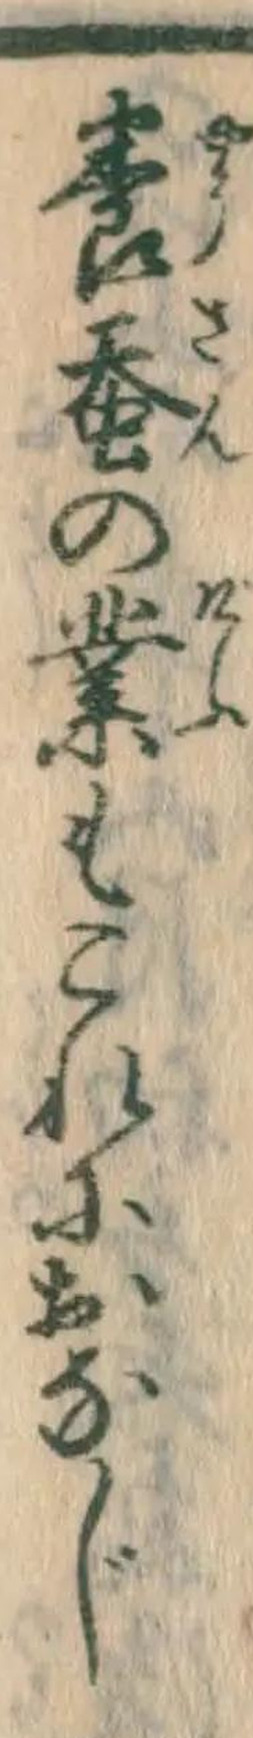養蚕の業もこれにおなじ
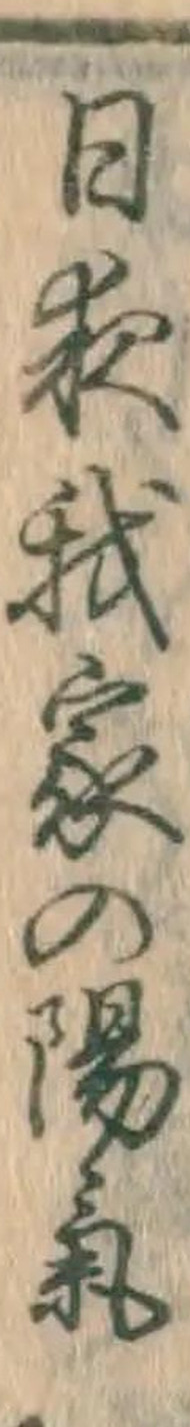日夜我家の陽気
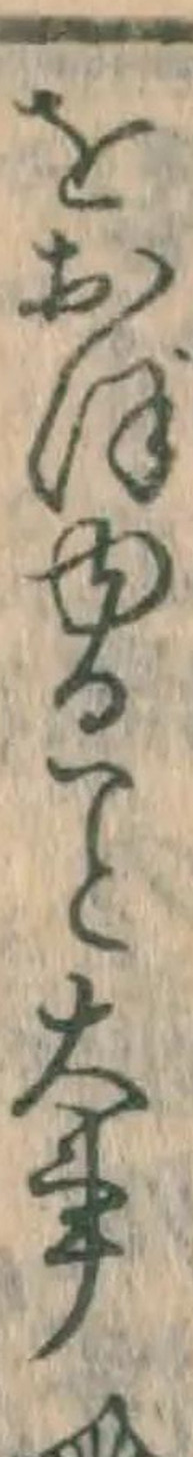をおぼゆること大事
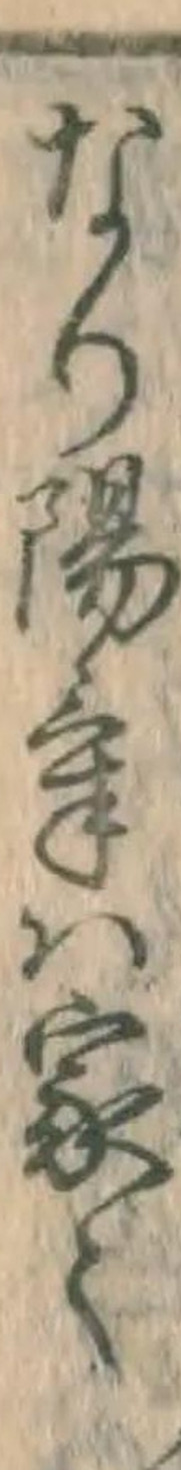なり陽気は家々
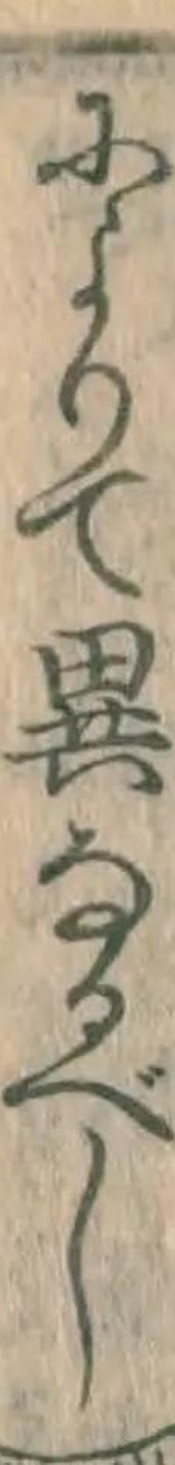によりて異なるべし
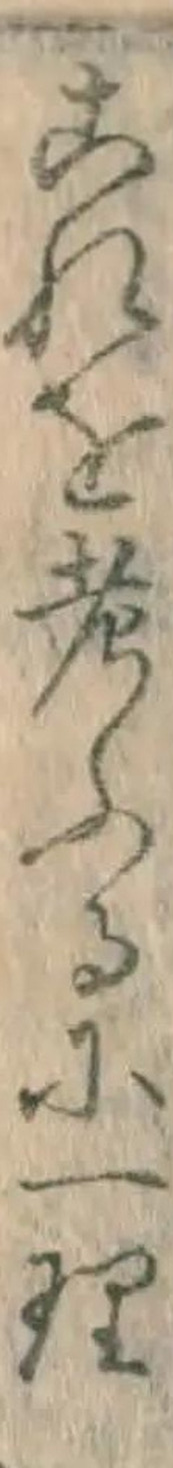これを考ふるに一理
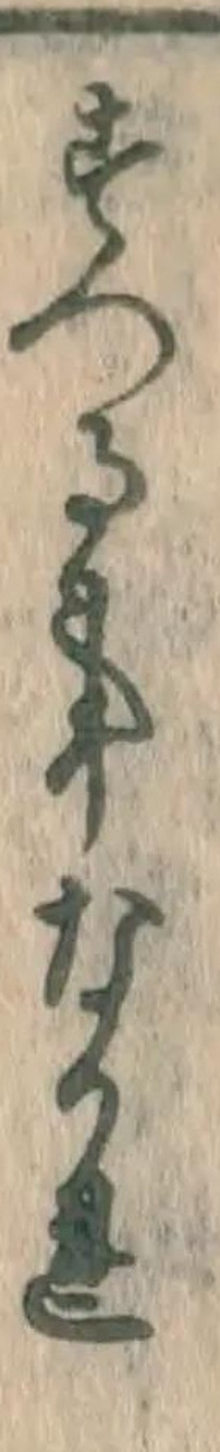すつる事なかれ

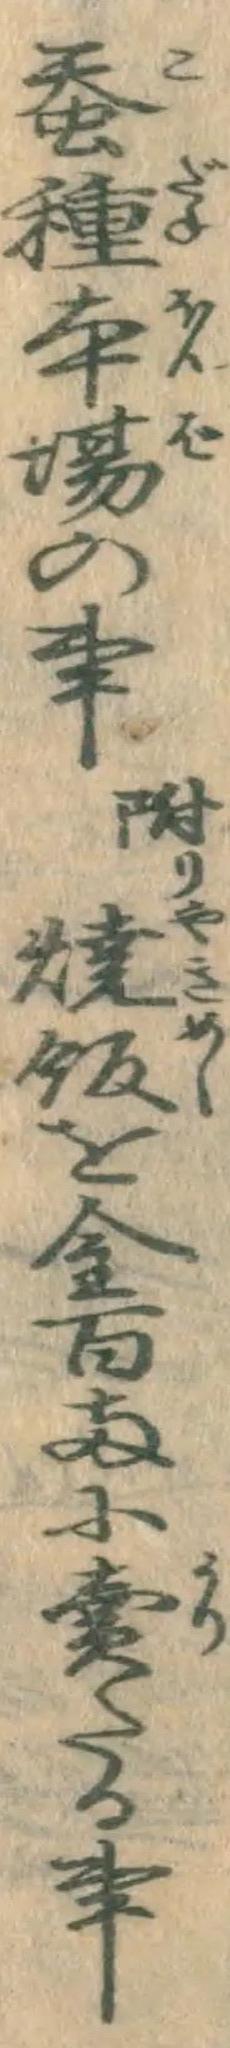蚕種本場の事附り焼飯を金百両に売たる事
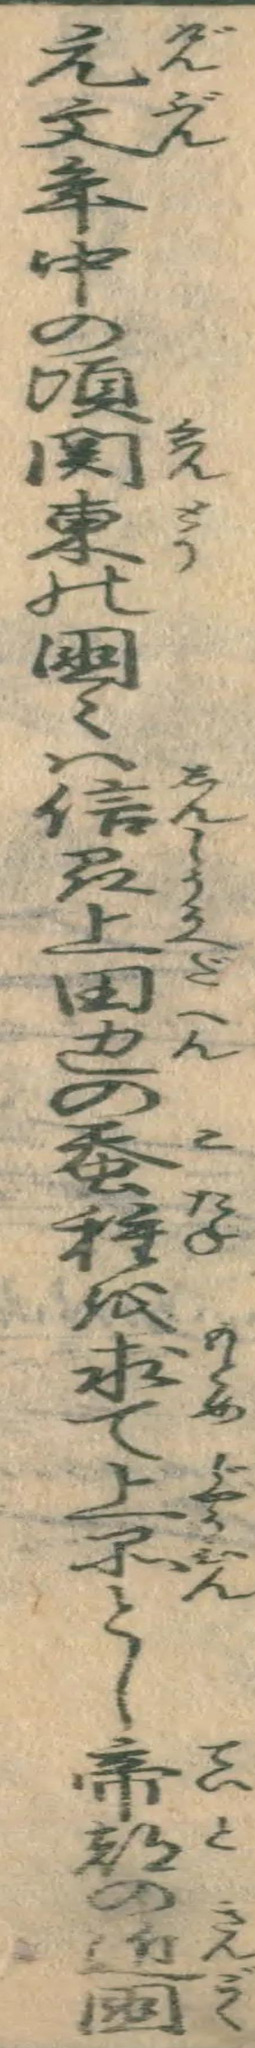元文年中の頃関東の国々は信州上田辺の蚕種を求て上品とし帝都の近国
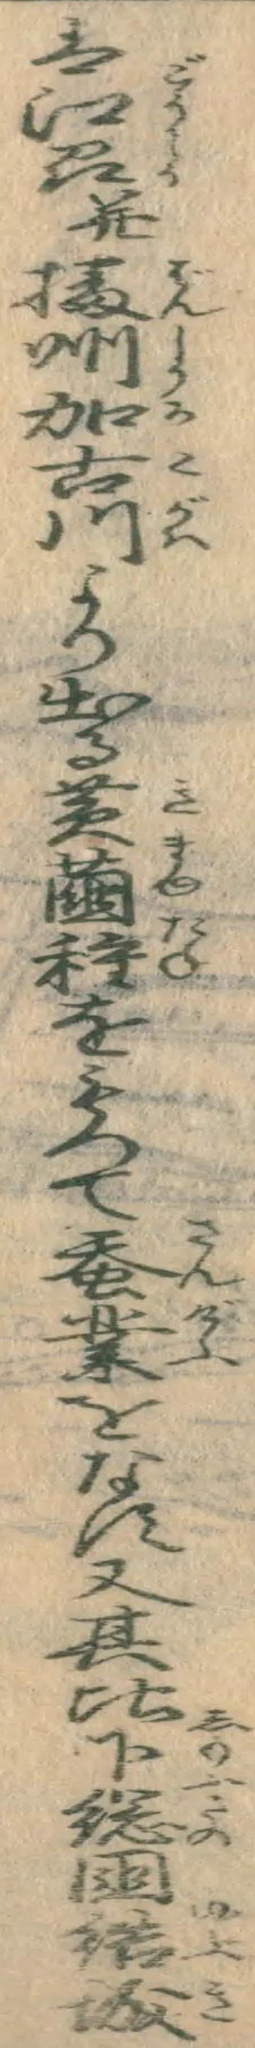は江州并播州加古川より出る黄繭種をもつて蚕業をなす又其頃下総国結城
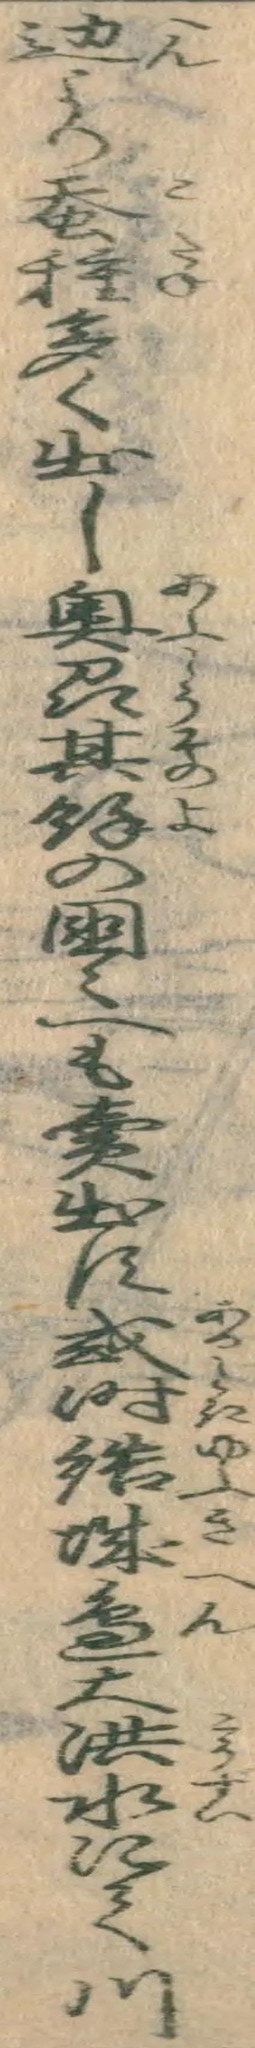辺より蚕種多く出し奥州其余の国々へも売出す或時結城辺大洪水にて川
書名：養蚕秘録 3巻. [3]
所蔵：国立国会図書館 National Diet Library, JAPAN
